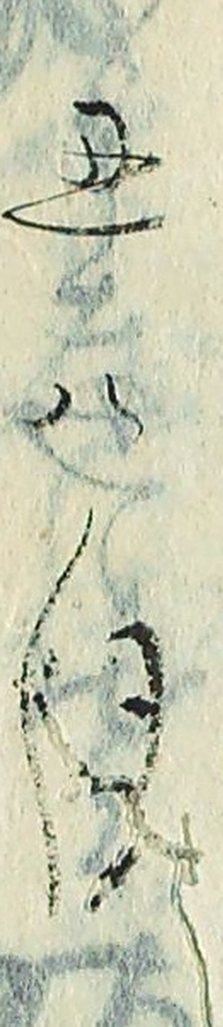丑八月
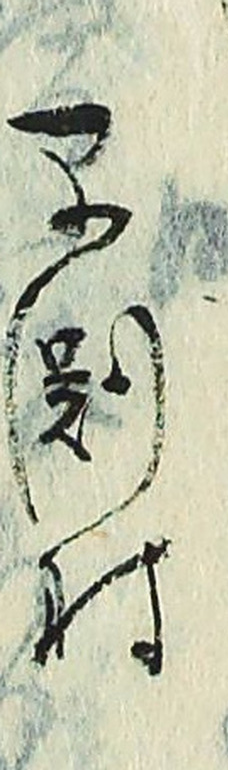早淵村
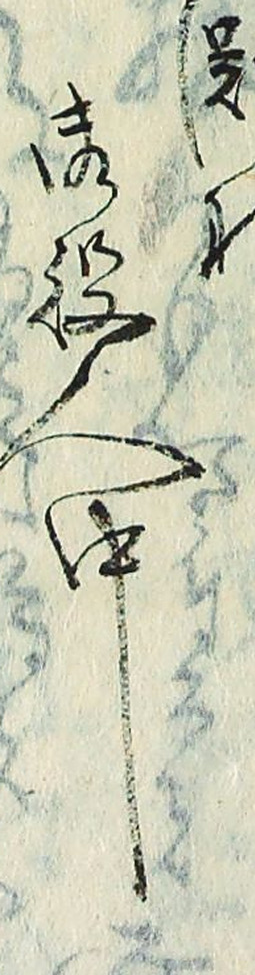御役人中
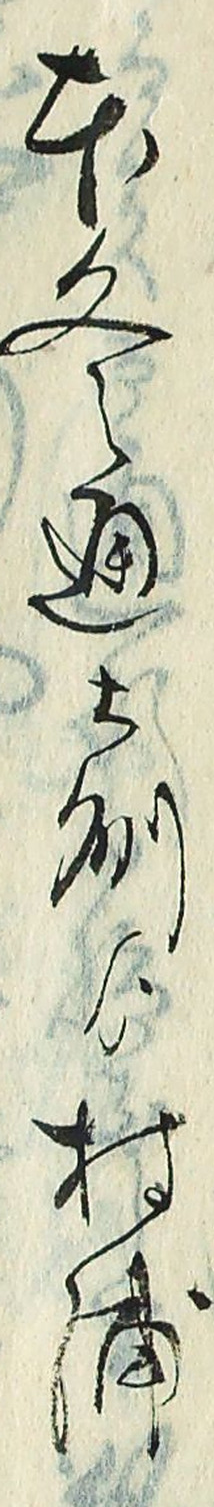本文之通土州ゟ村浦
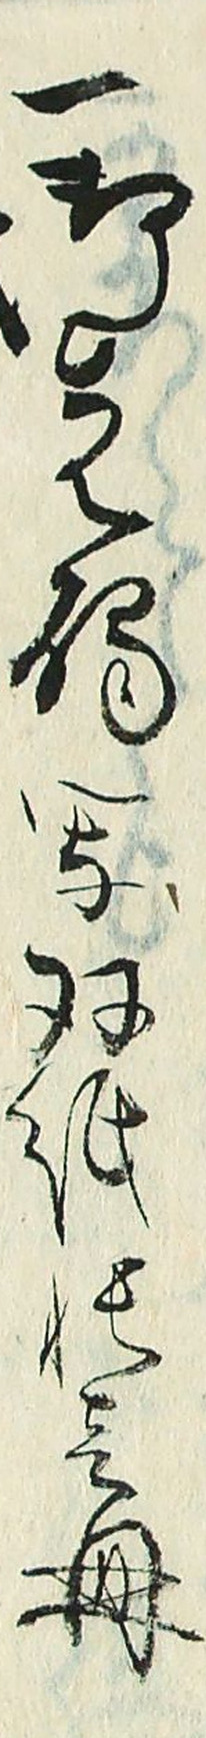一御先触写双紙帳壱冊
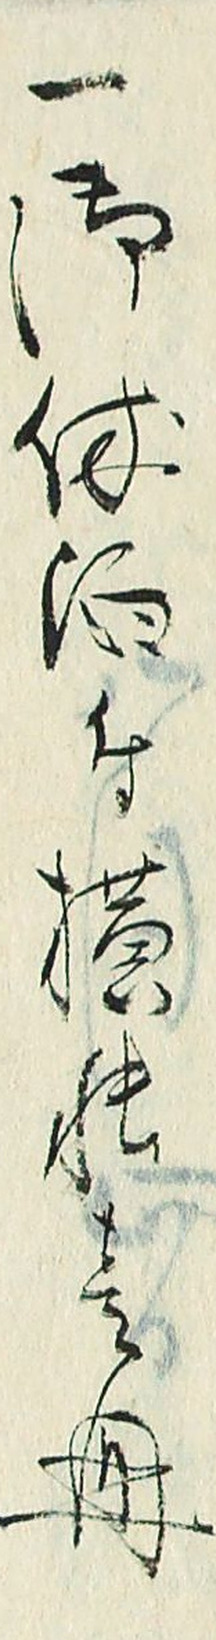一御休泊付横帳壱冊

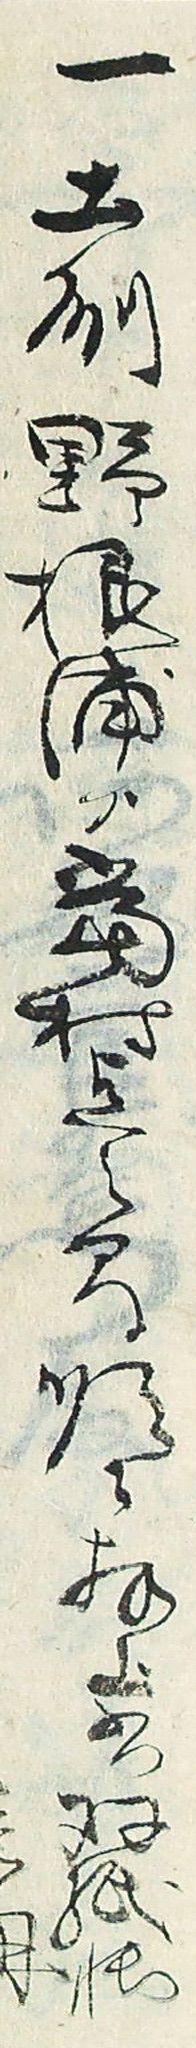一土州野根浦ゟ当村迄之間順々拝上書双紙帳壱冊
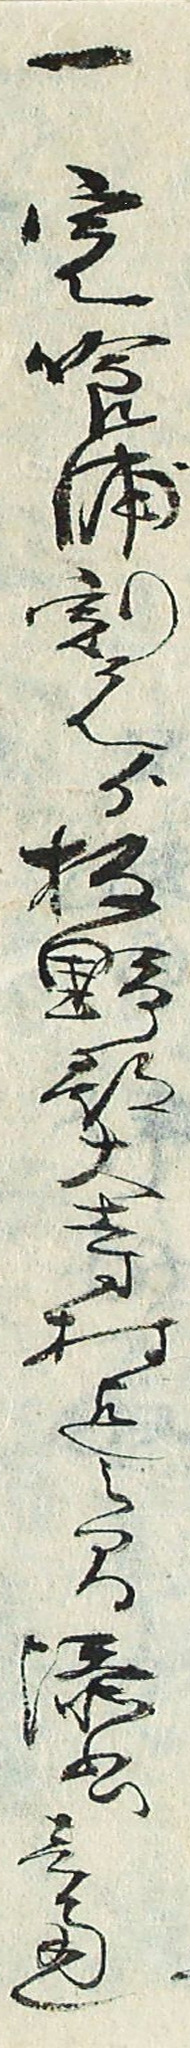一宍喰浦割元ゟ板野郡大寺村迄之間添書壱通
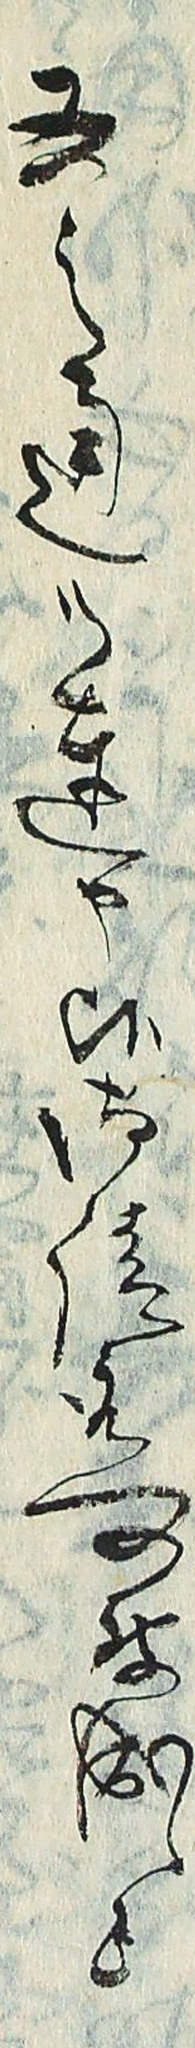右之通御達申候御請取可被成候以上
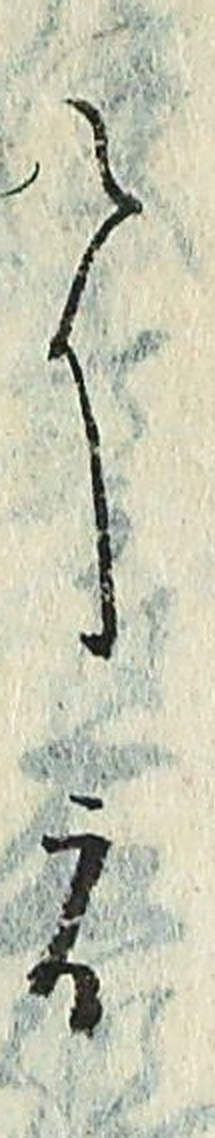八月四日
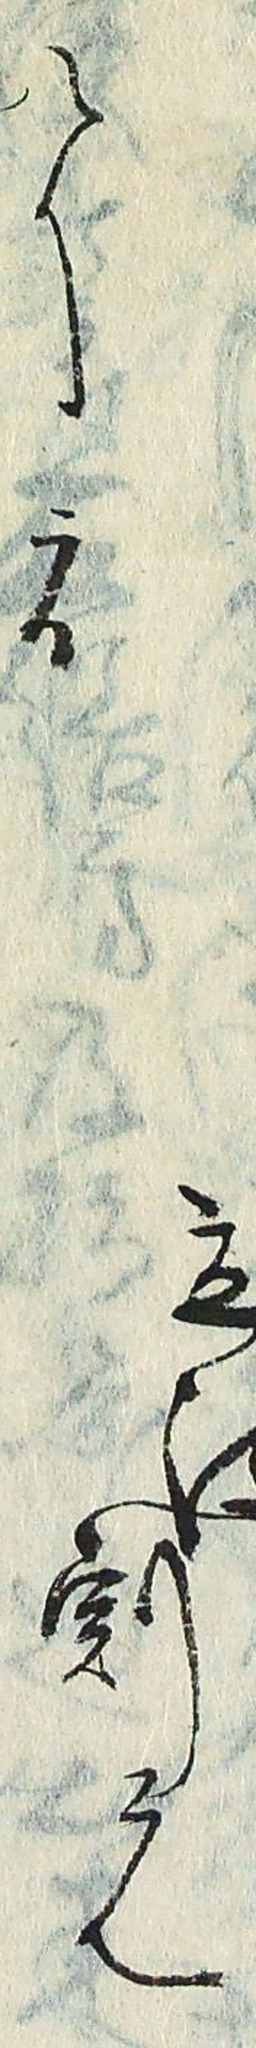八月四日
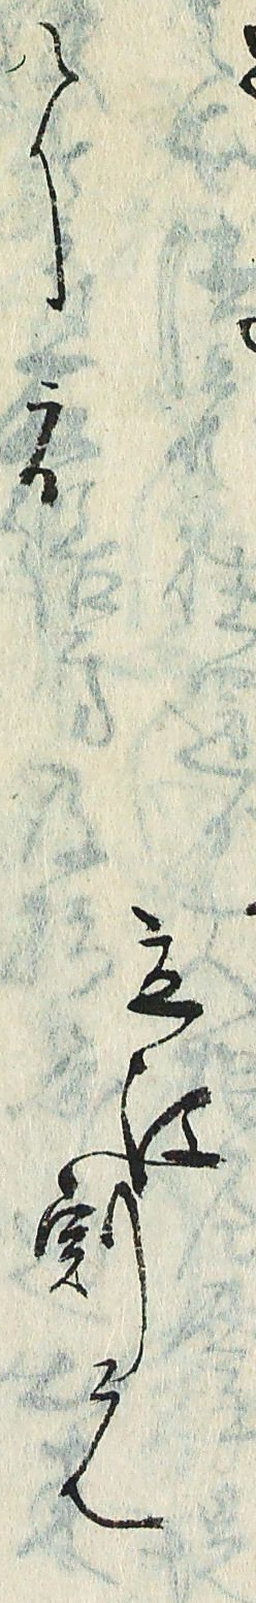八月二日割元
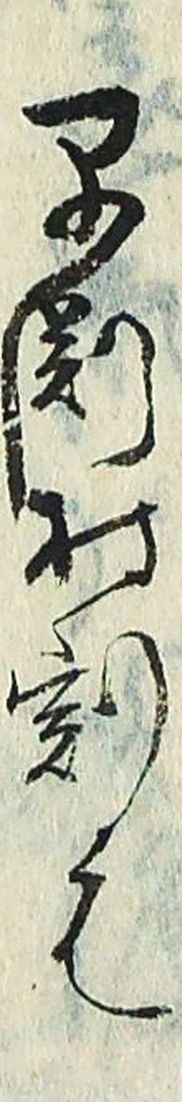早淵村割元
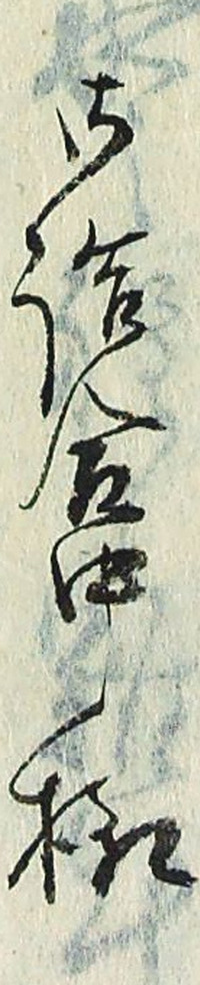御詰合中様
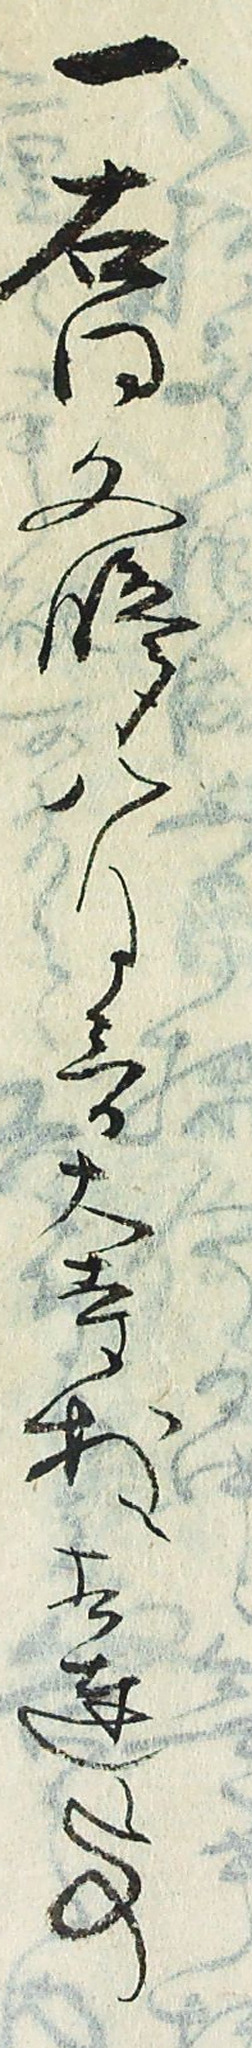一右同文段にして八月三日大寺村へ相達候事
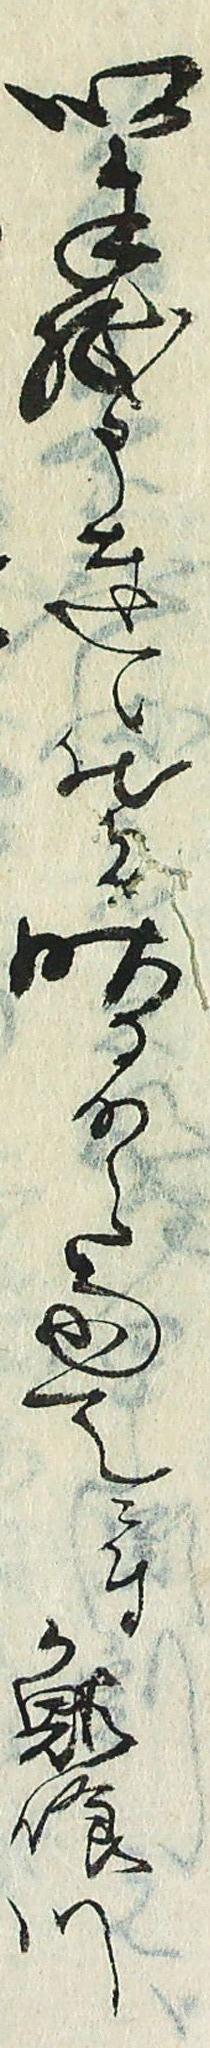以手紙申達候然は昨日ゟ之雨天に付鮎喰川
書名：公辺御役人為御廻浦御立越諸御用一巻
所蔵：鳴門教育大学 Naruto University of Education
